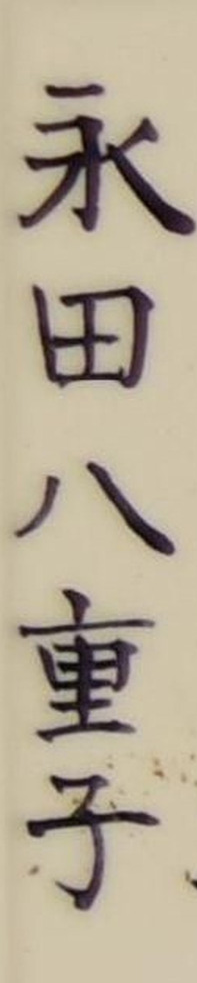永田八重子

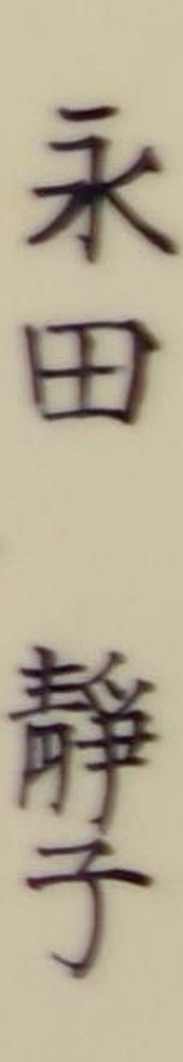永田静子
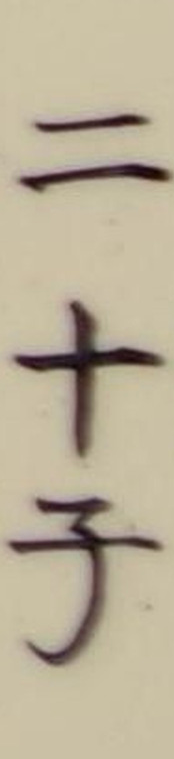二十子
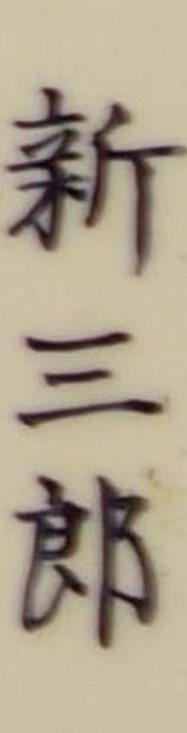新三郎
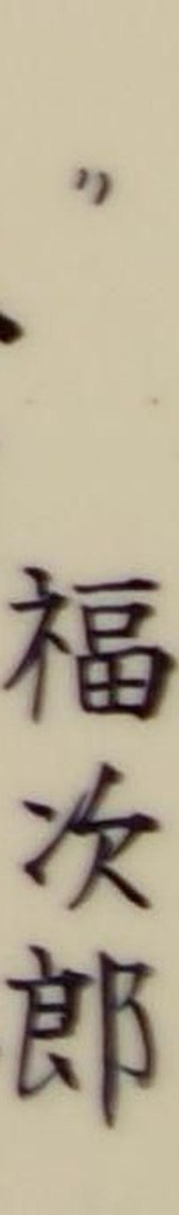福次郎
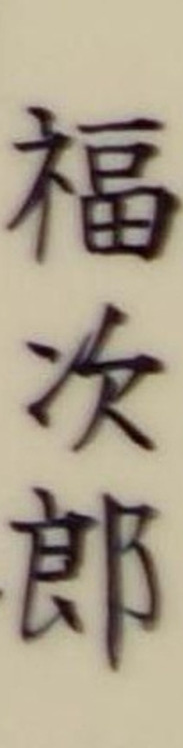福次郎
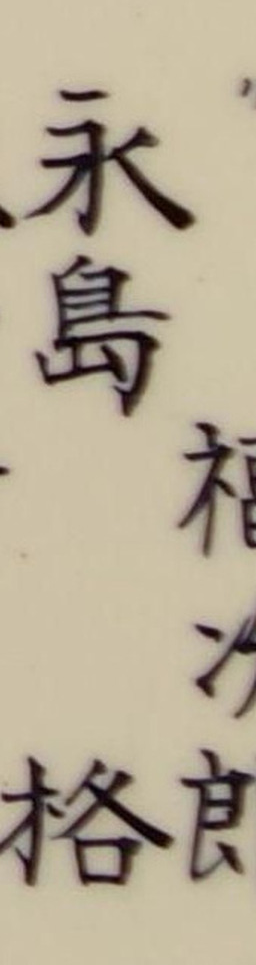永島格
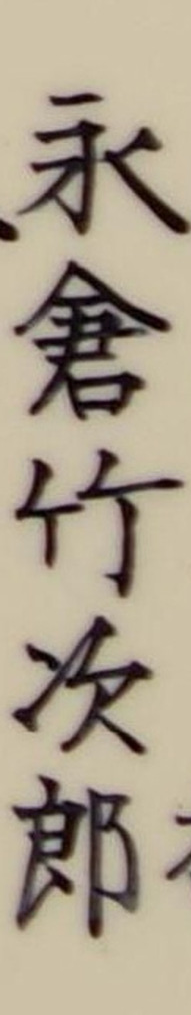永倉竹次郎
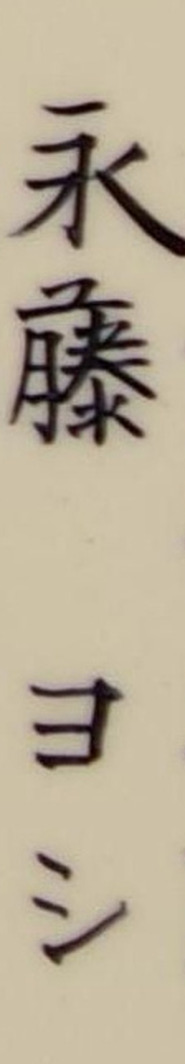永藤ヨシ
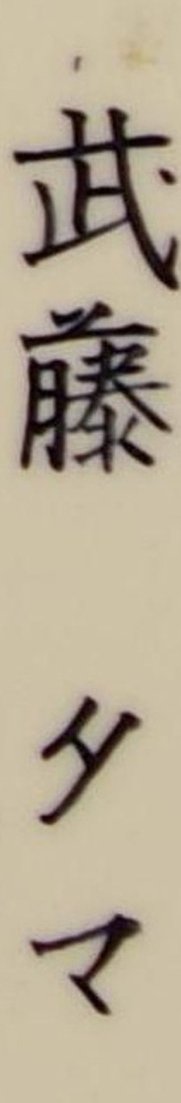武藤夕マ
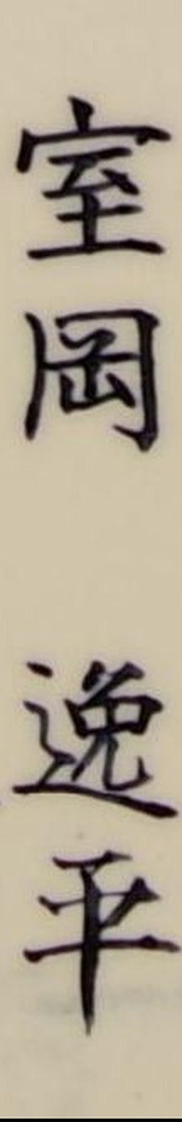室岡逸平
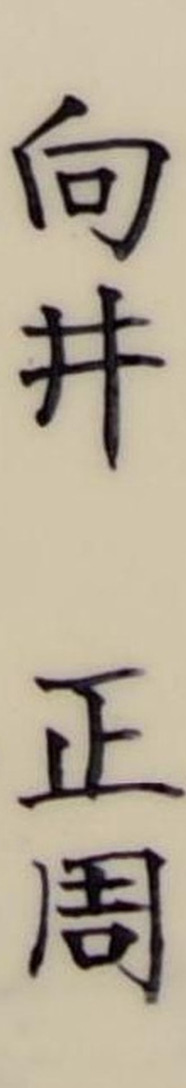向井正周
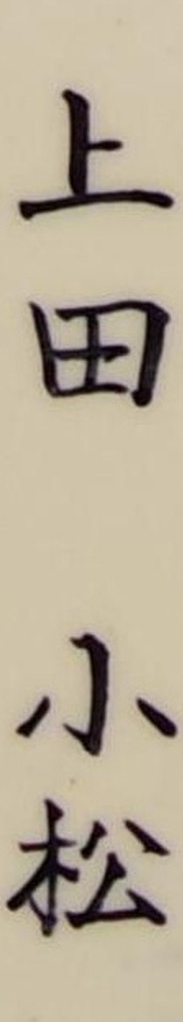上田小松
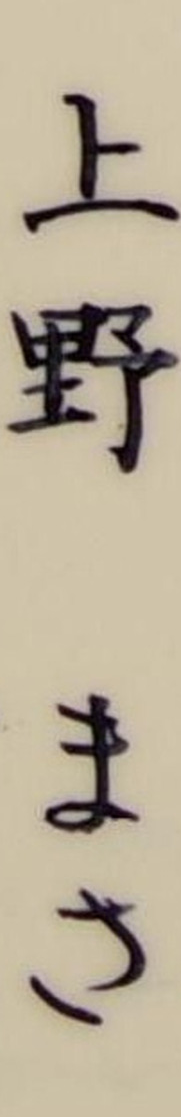上野まさ
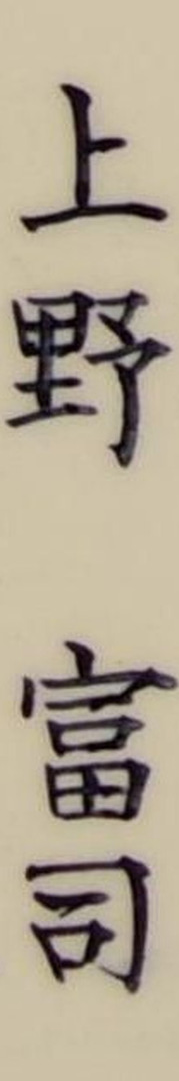上野富司
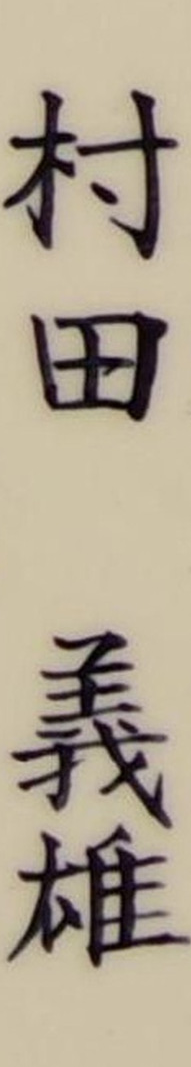村田義雄
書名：E~L
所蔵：高野山金剛峯寺
